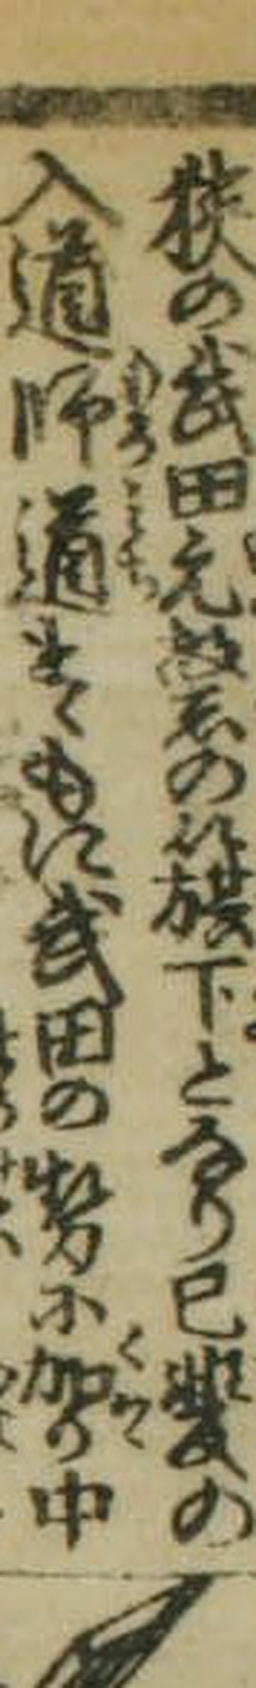入道師道とゝもに武田の勢に加り中
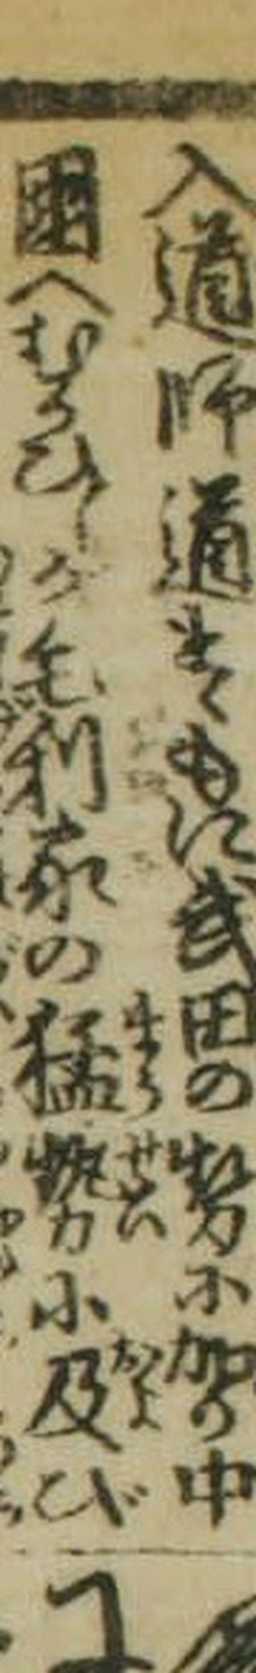国へむかひしが毛利家の猛勢に及び
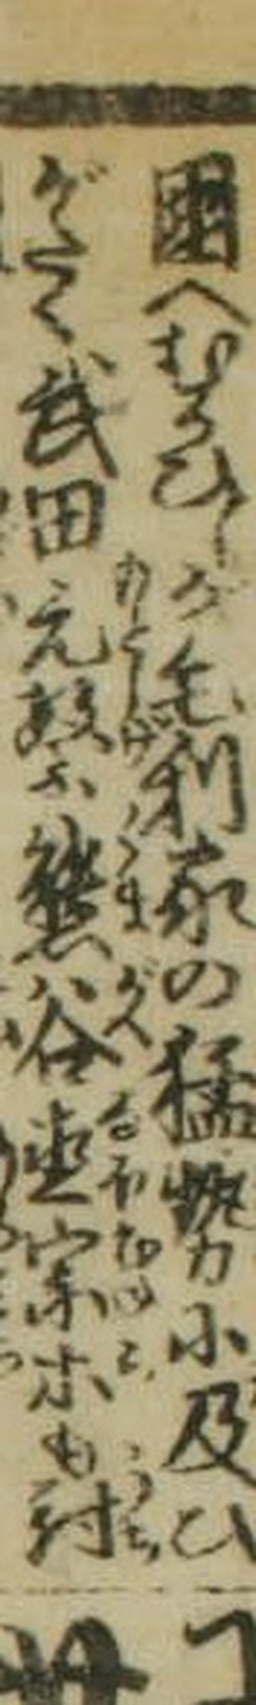がたく武田元繁熊谷直宗等も討
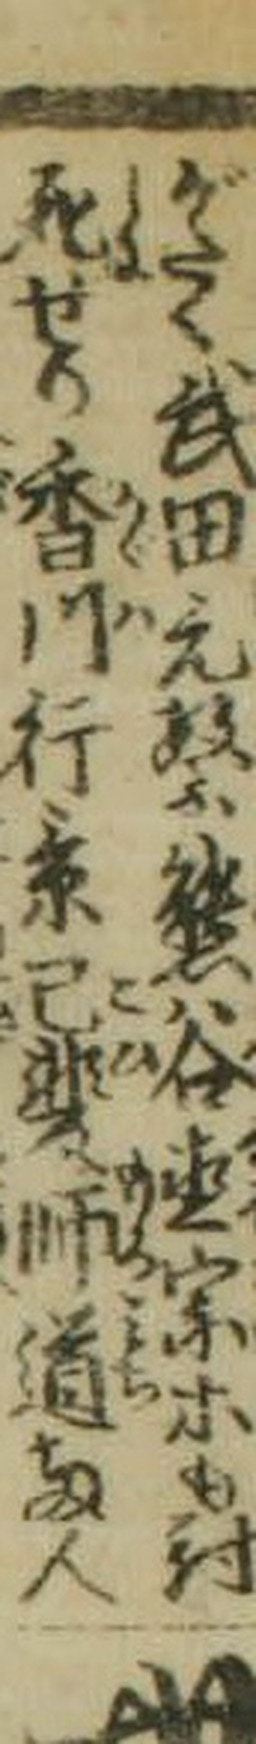死せり香川行景己斐師道両人
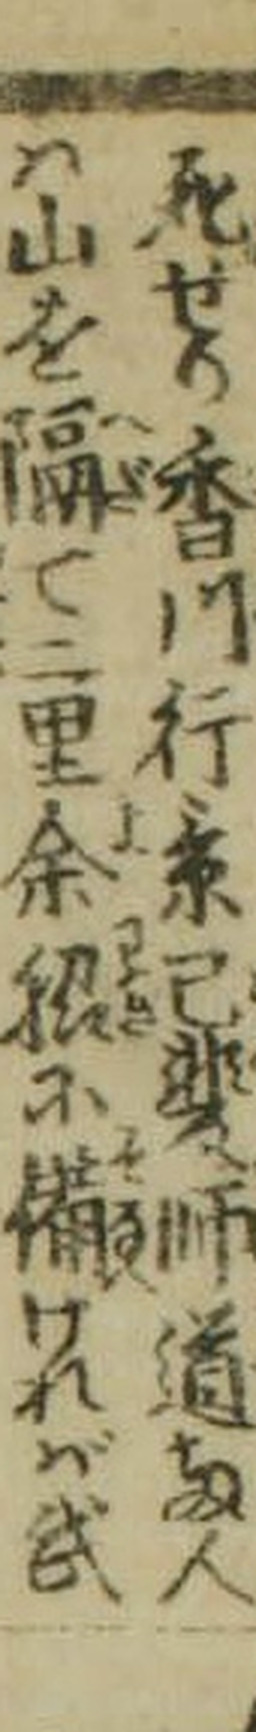は山を隔て二里余脇に備ければ武
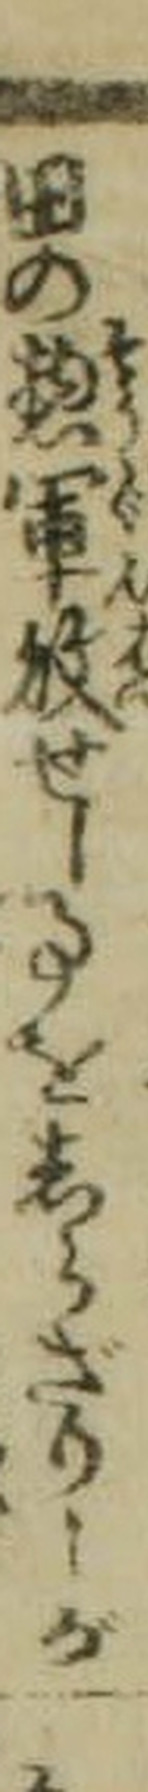田の惣軍敗せし事をしらざりしが
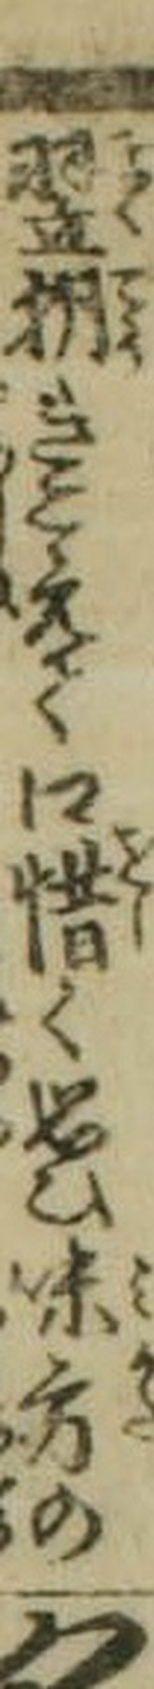翌朝きこえて口惜く思ひ味方の
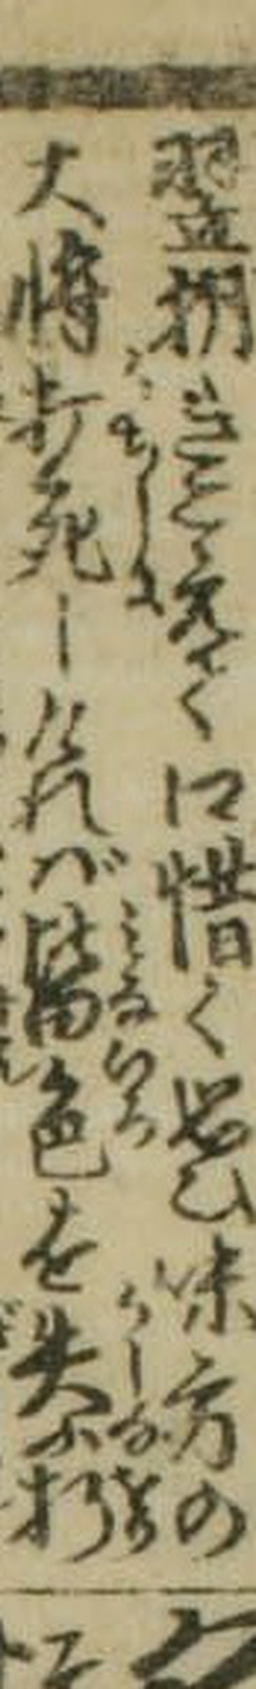大将打死しければ皆色を失ふ折
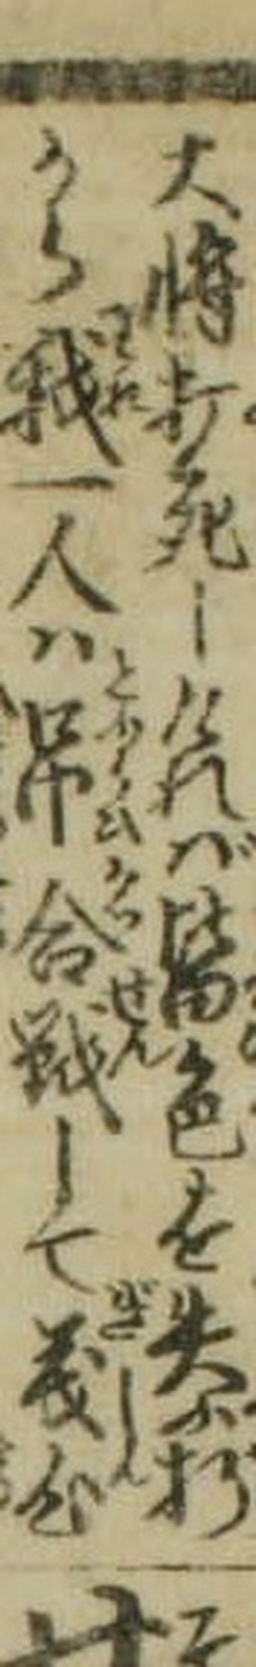から我一人は弔合戦して義心
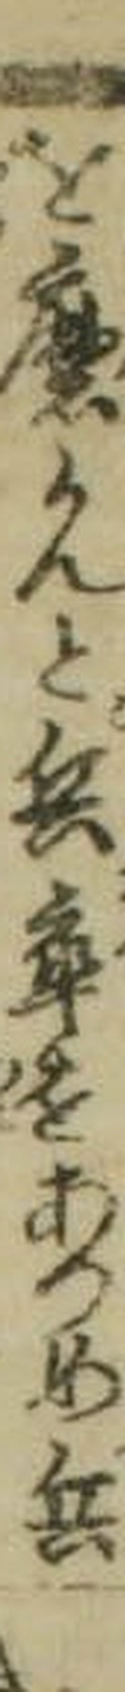を磨かんと兵卒をあつめ兵
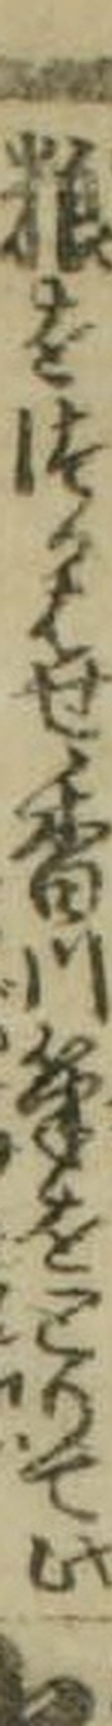粮をつかはせ香川筆をとりて此
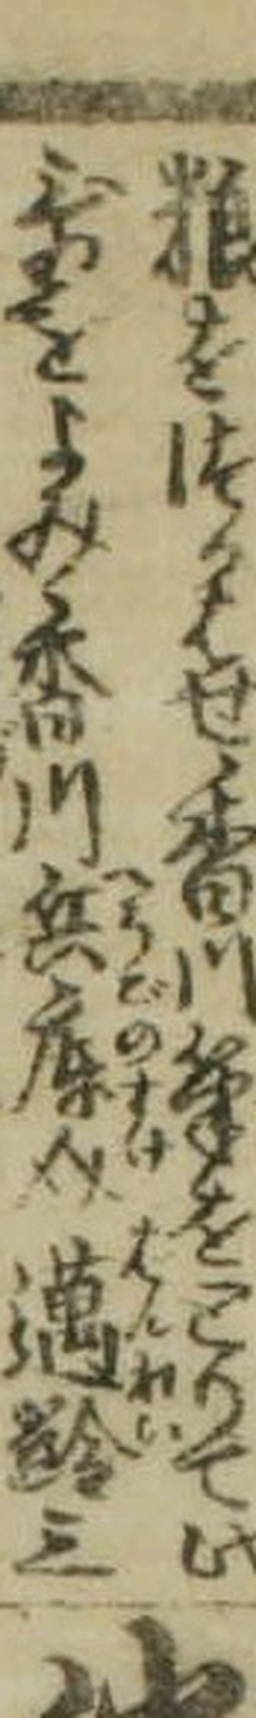歌をよみ香川兵庫介邁齢三
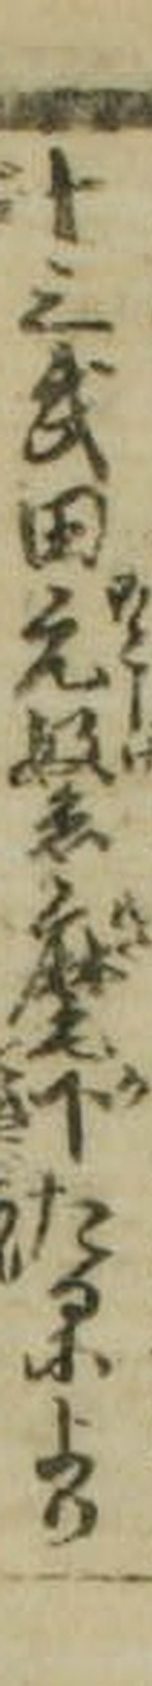十三武田元繁麾下たるにより
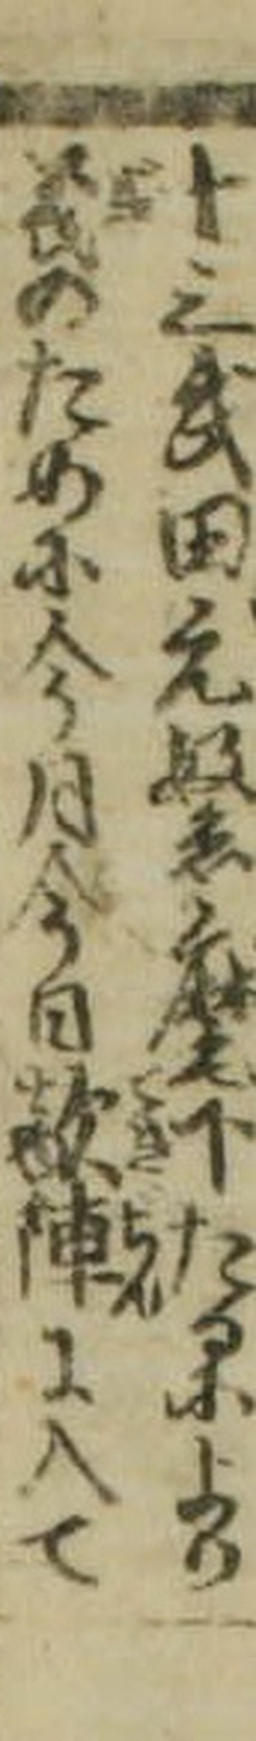義のために今月今日敵陣に入て
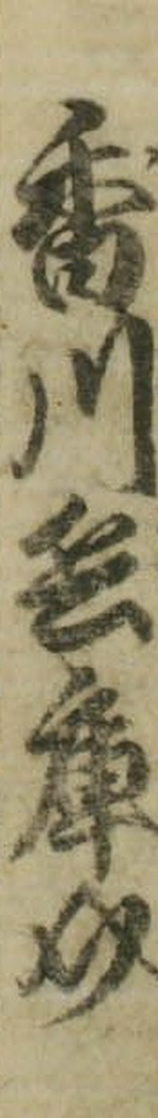香川兵庫介
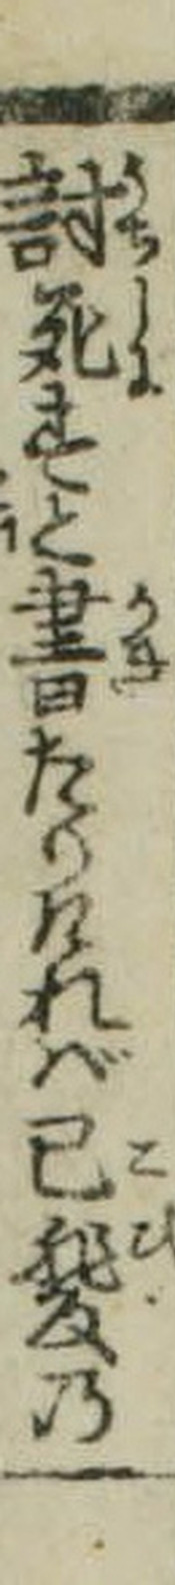討死すと書たりければ己斐の
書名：續英雄百人一首
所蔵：東京学芸大学附属図書館
